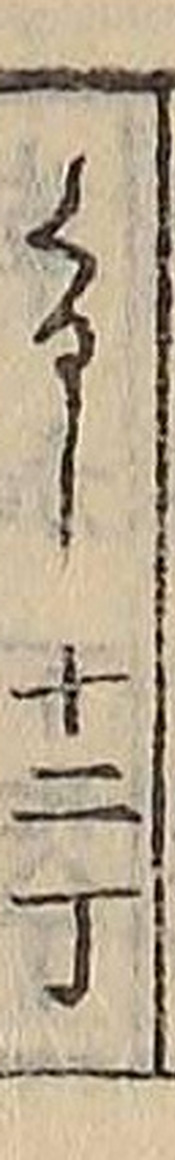くるし十二丁
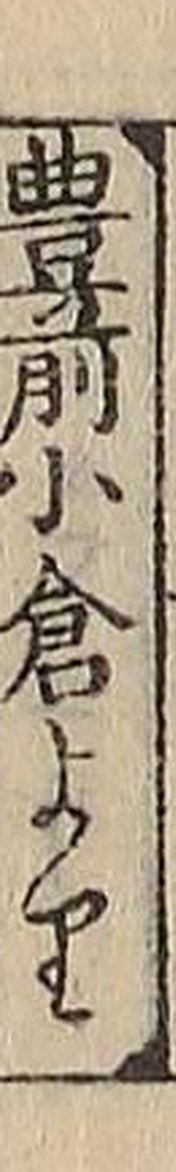豊前小倉より
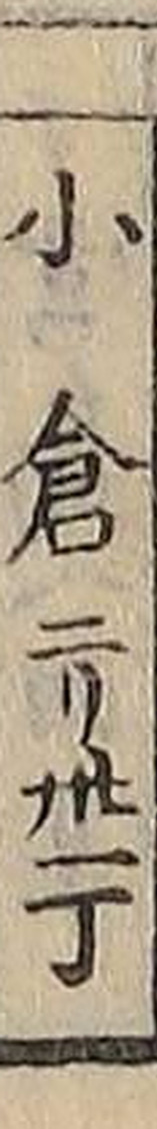小倉二リ卅一丁
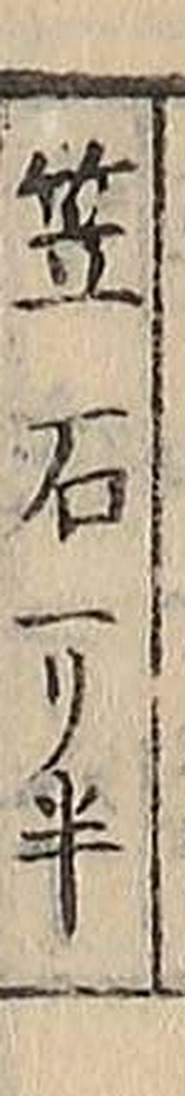笠石一リ半
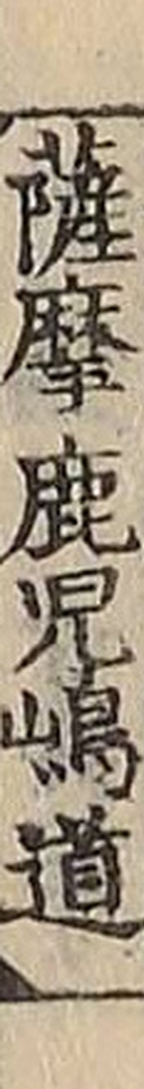薩摩鹿児島道
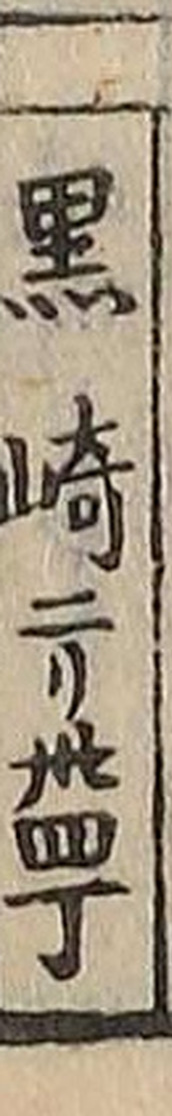黒崎二リ卅四丁
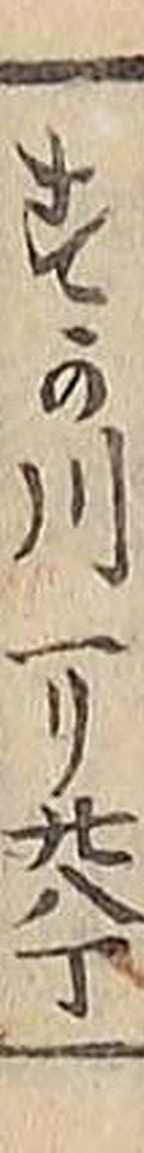すか川一リ廿八丁
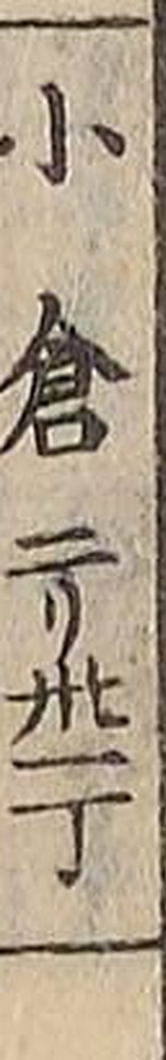小倉二リ卅一丁
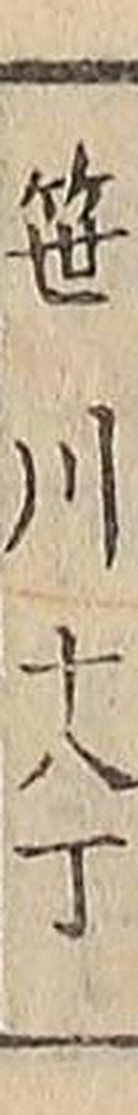笹川十八丁
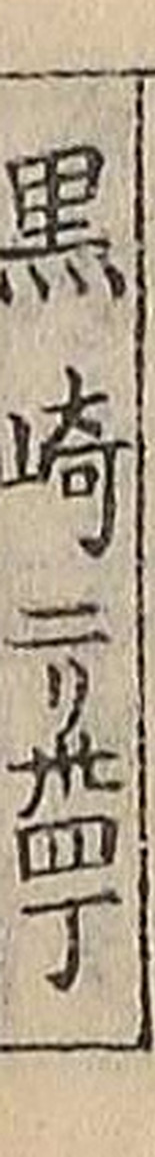黒崎二リ卅四丁
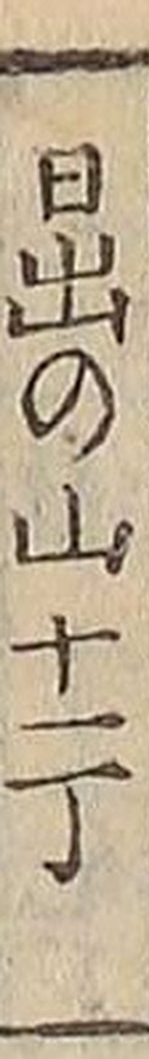日出の山十一丁
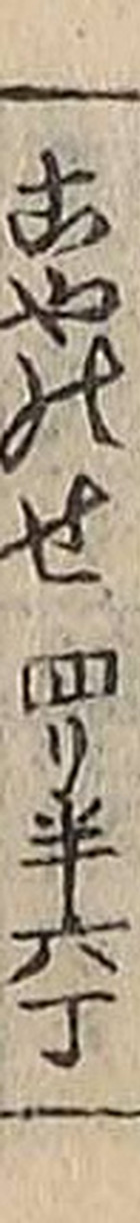こやのせ四リ半六丁
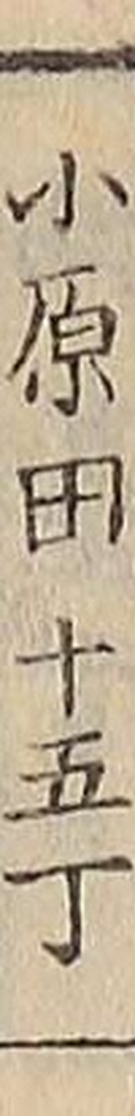小原田十五丁
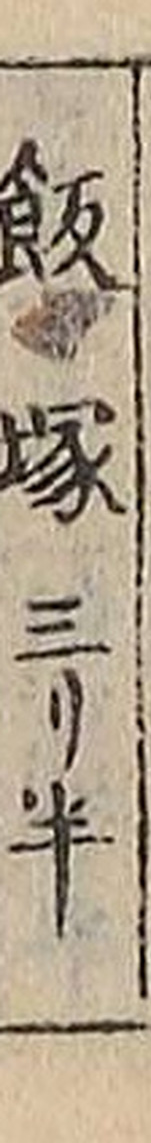飯塚三リ半
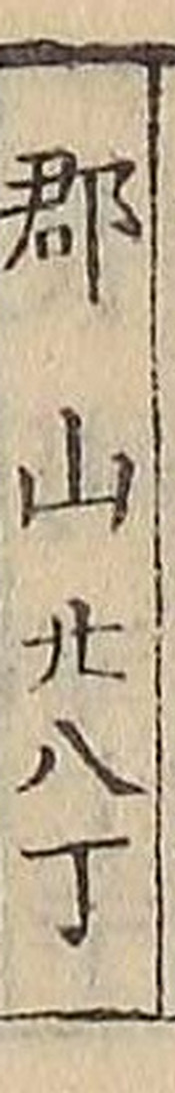郡山廿八丁
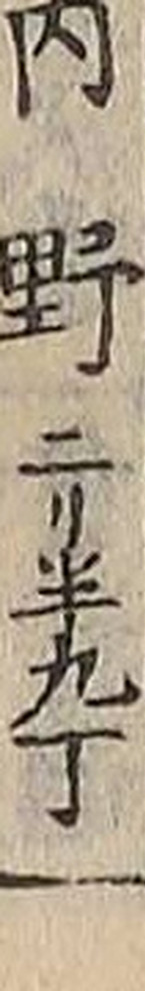内野二リ半九丁
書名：旅行用心集
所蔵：神戸大学附属図書館 国文学研究資料館
